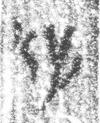枳（枝）
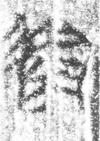○（錦）
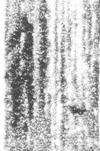純
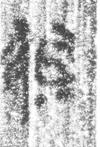組
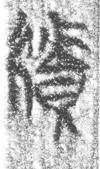○（繬）
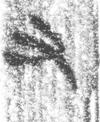又
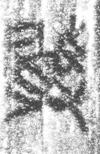{骨夬}
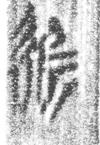○（裾）
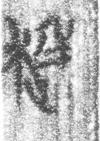○（枕）
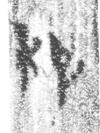枳
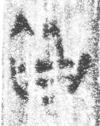皆
